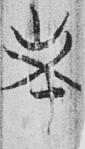未
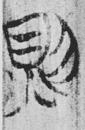則
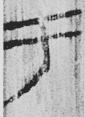于
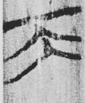天
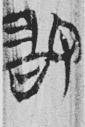敢
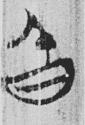昏（問）
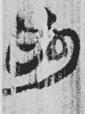爲
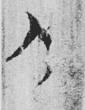人
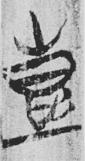彭
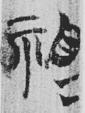祖
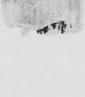曰
